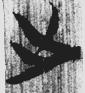之
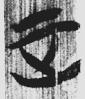正
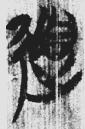道
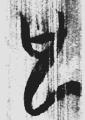也
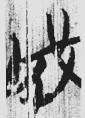成
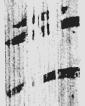王
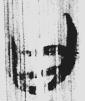曰
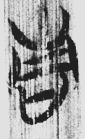青（請）
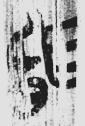䎽（問）
